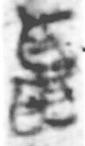聶（攝）
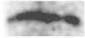一
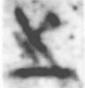之
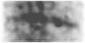一
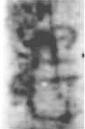○（貍）
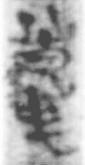○（貘）
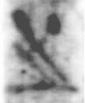之
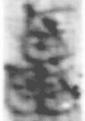聶（攝）
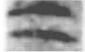二
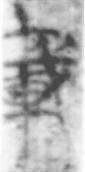載
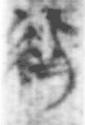紫
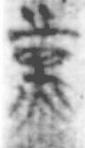黃
